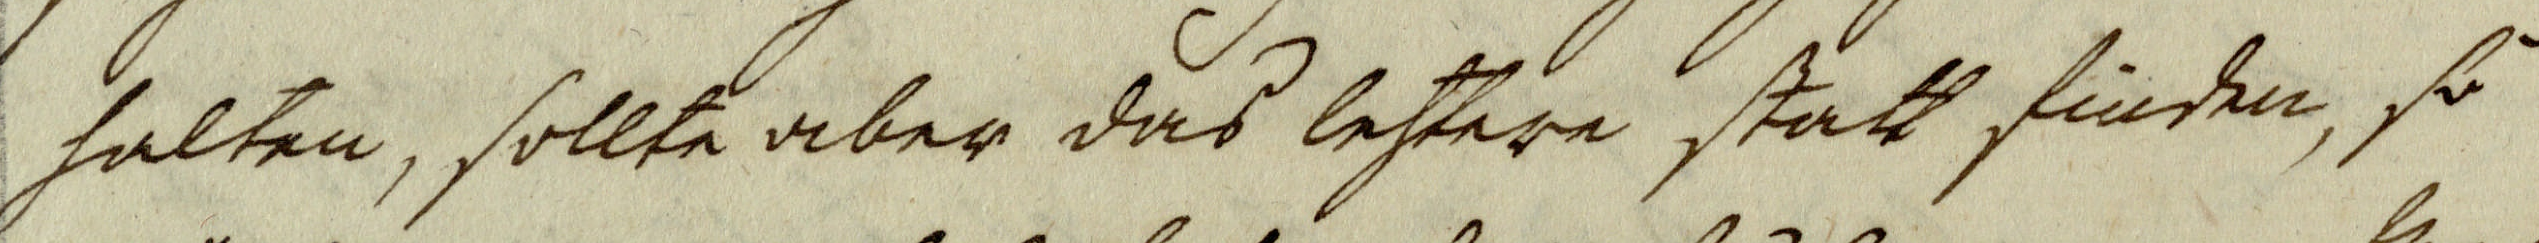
halten, sollte aber das letztere statt finden, so
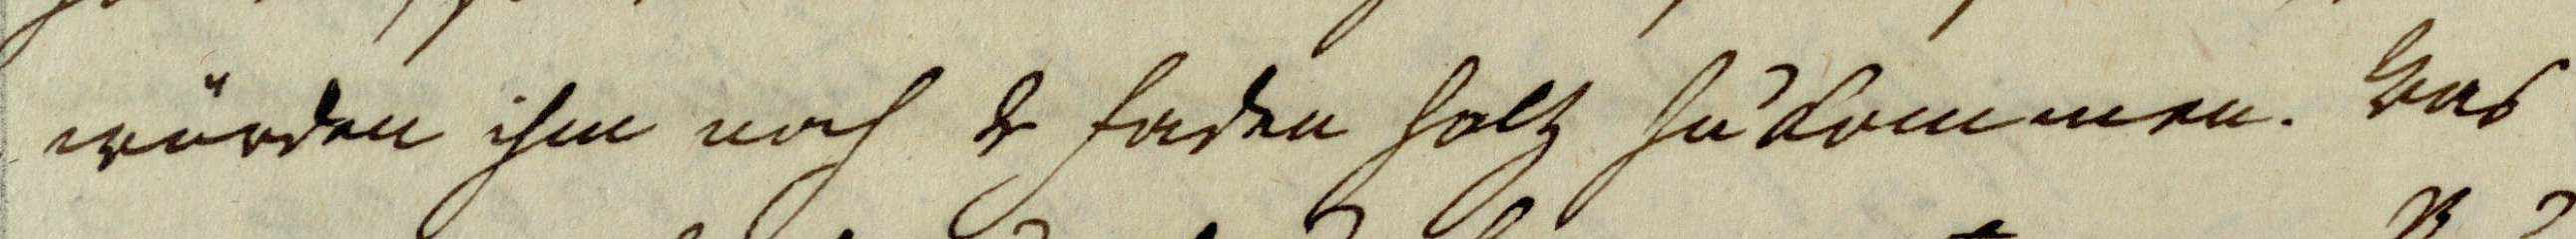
würden ihm noch 2 Faden Holz zukommen. Was
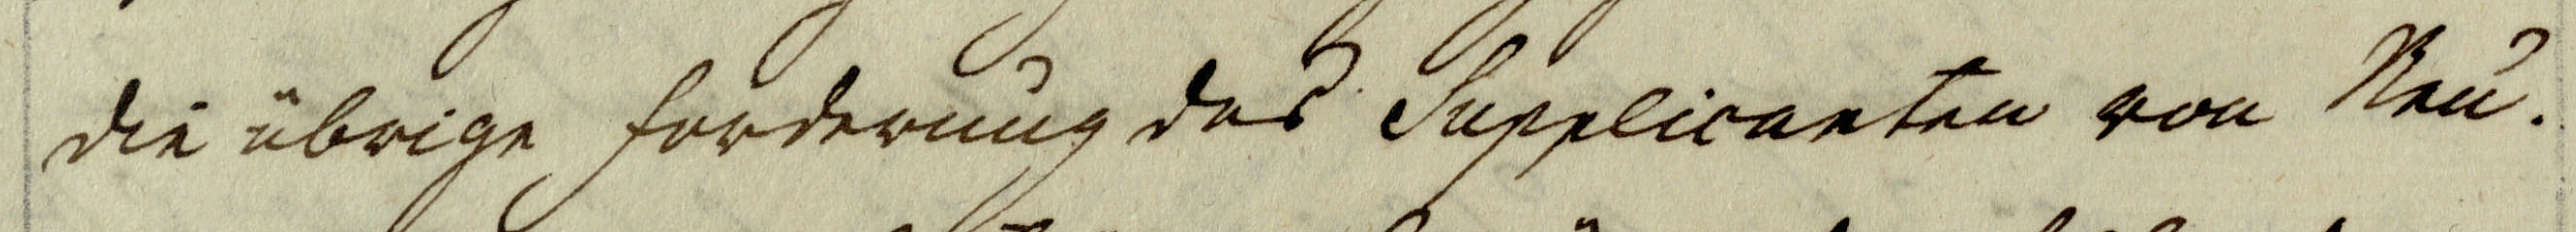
die übrige Forderung des Supplicanten von Neu¬
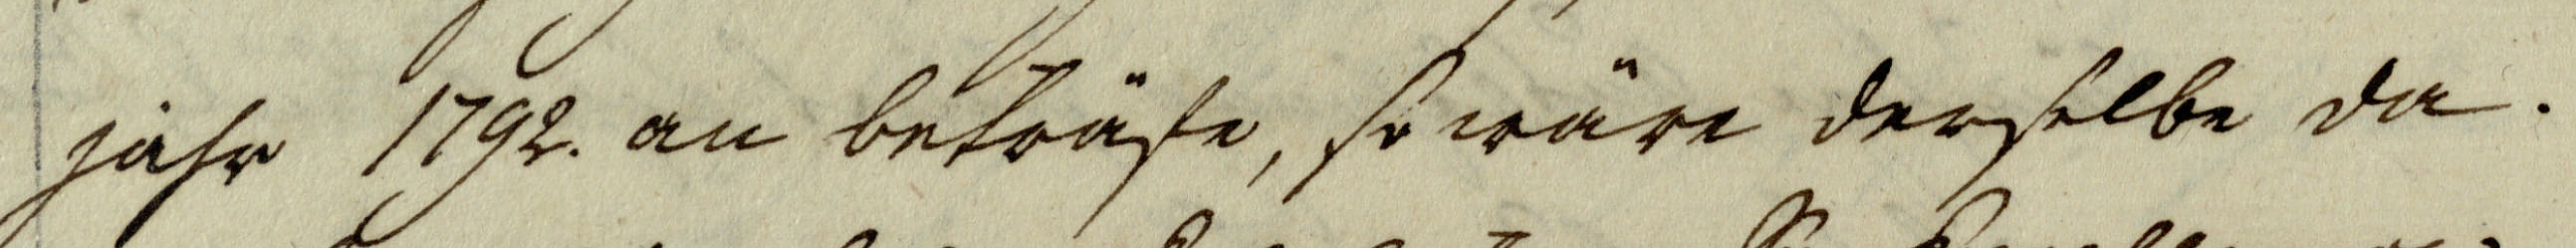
jahr 1792. an beträfe, so wäre derselbe da¬
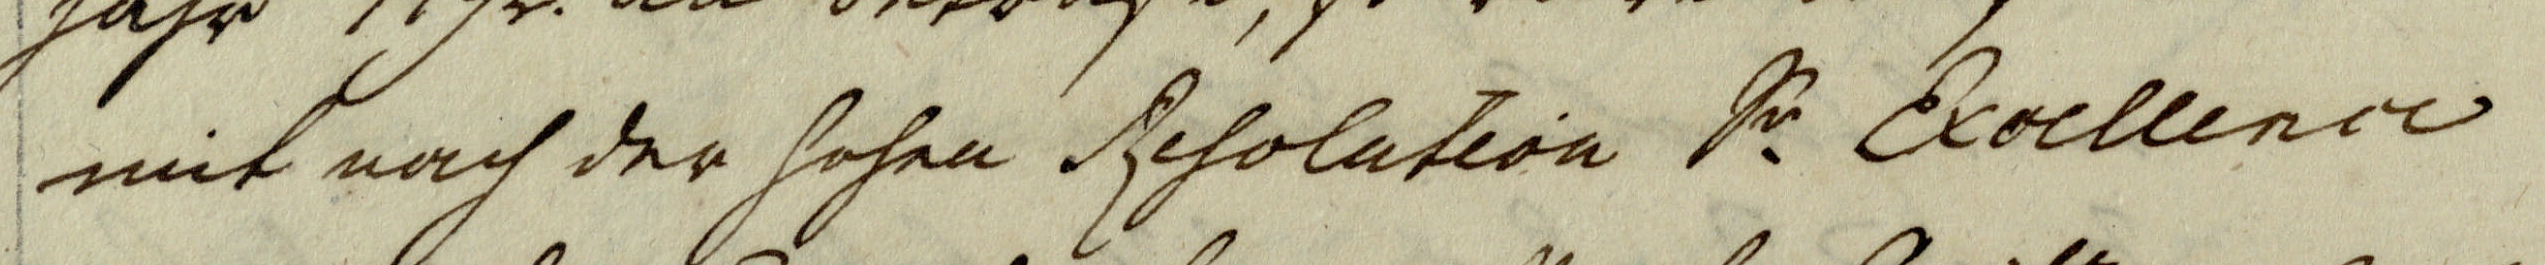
mit nach der hohen Resolution Sr. Excellence
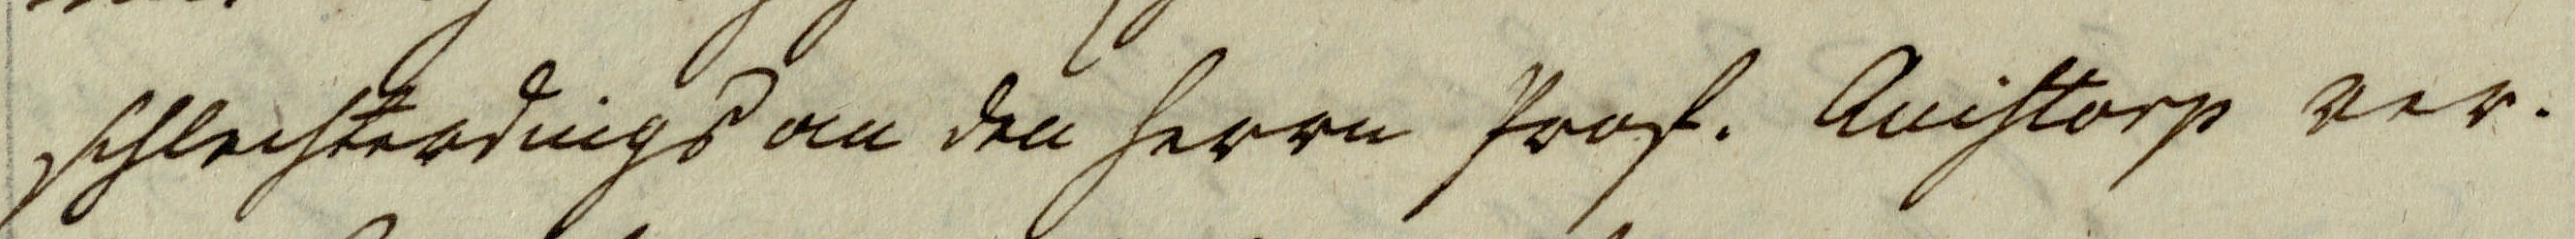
schlechterdings an den Herrn Prof. Quistorp ver¬
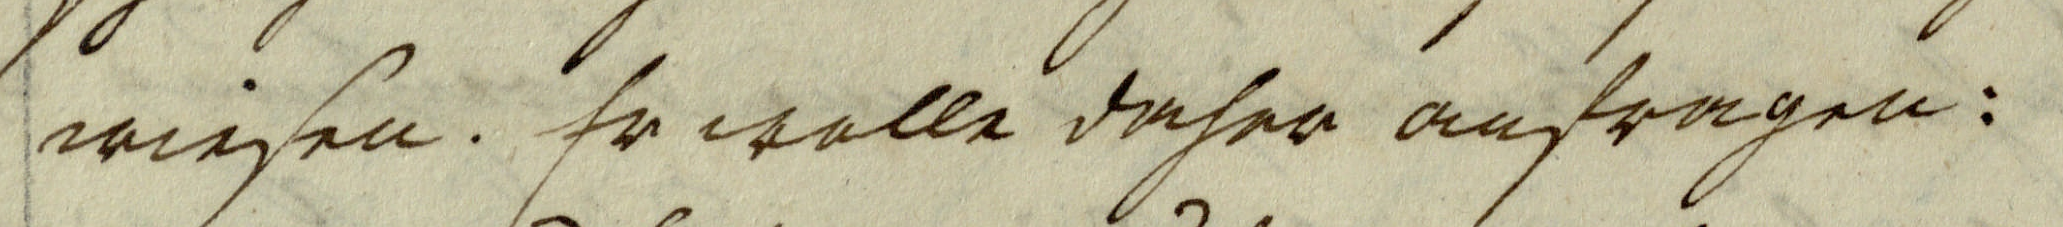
wiesen. Er wolle daher anfragen:
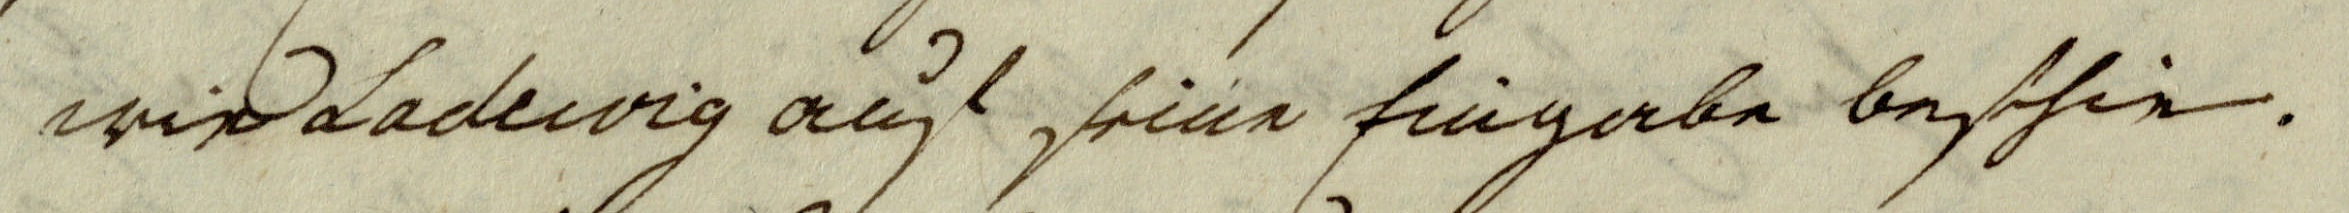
wie Ladewig auf seine Eingabe beschie¬
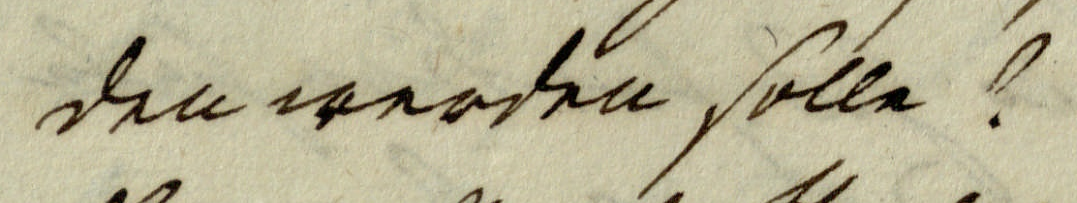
den werden solle?
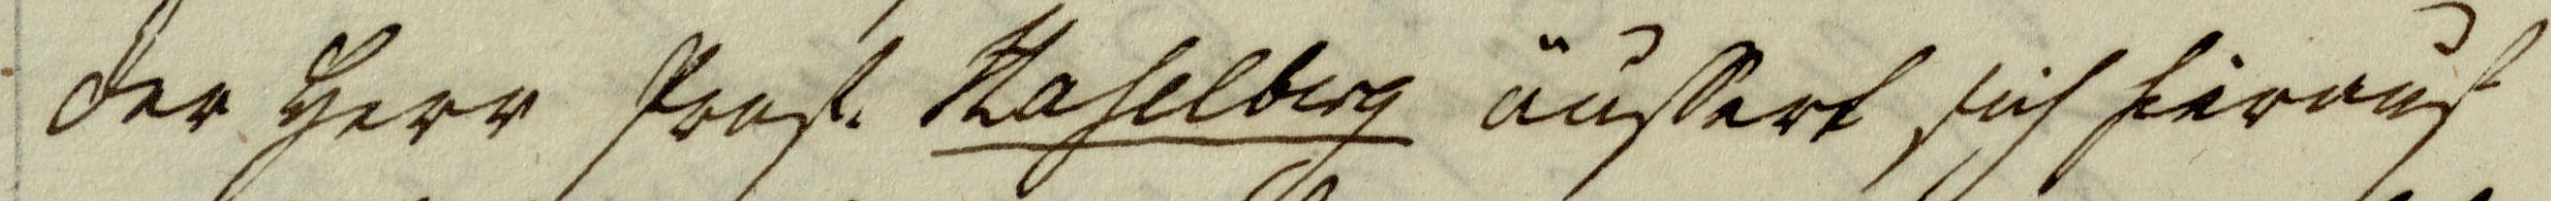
Der Herr Prof. Haselberg äussert sich hierauf
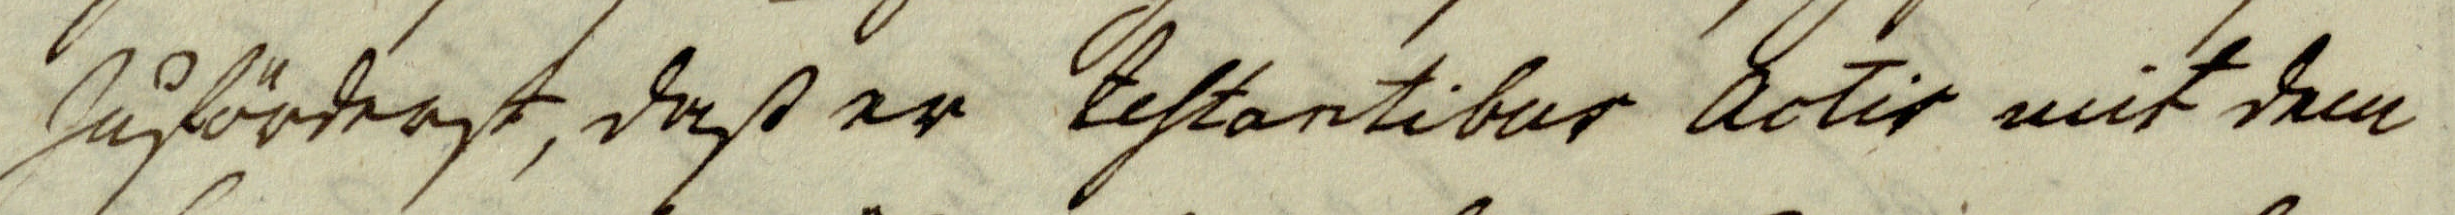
zuförderst, daß er Restantibus Actis mit dem
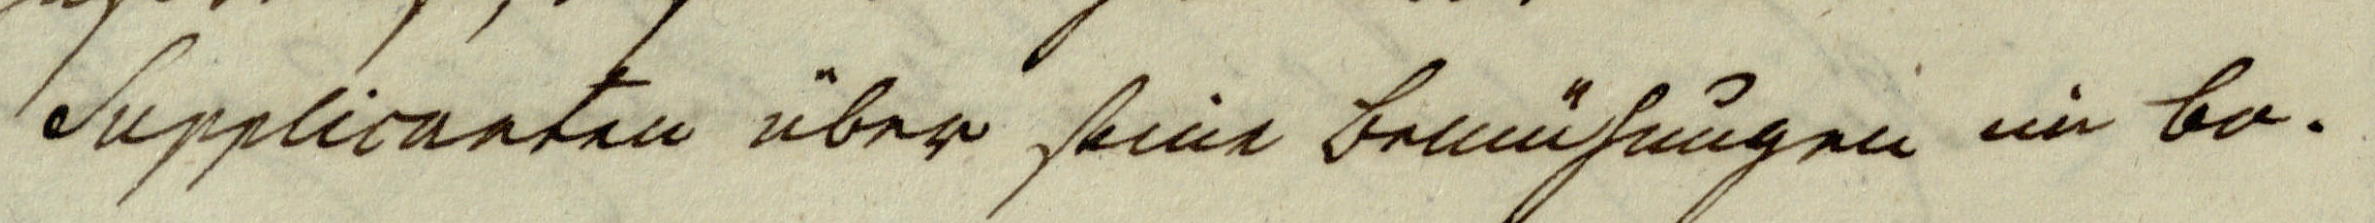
Supplicanten über seine Bemühungen im bo¬
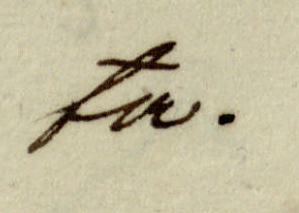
ta¬
